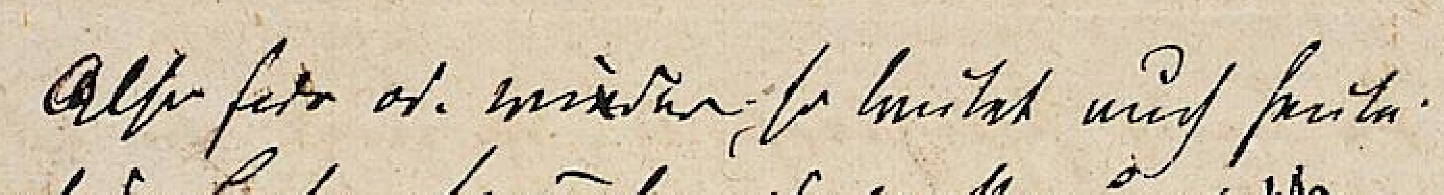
Also für od. wider; so lautet auch heute
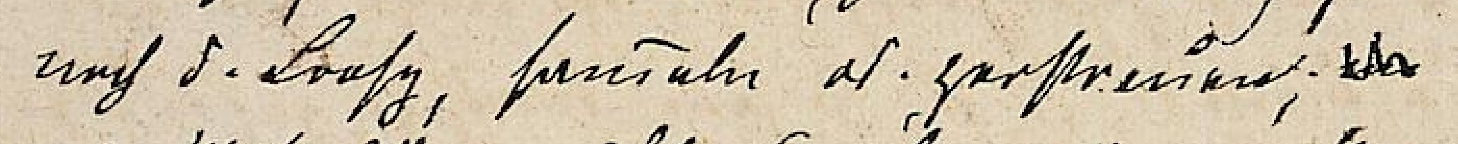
nach d. Loosg, sameln od. zerstreuen; im
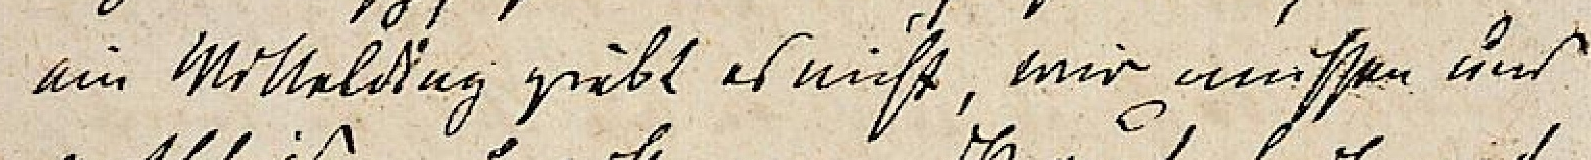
ein Mittelding giebt es nicht, wir müssen uns
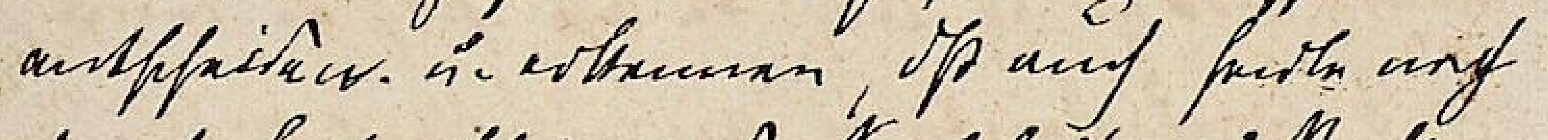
entscheiden u. erkennen, dß auch heute noch
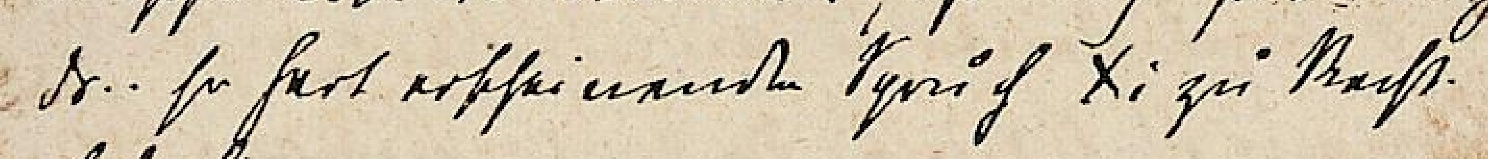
dr so hart erscheinende Spruch Χι zu Recht
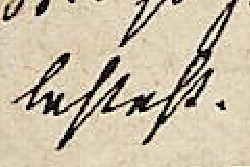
besteht.
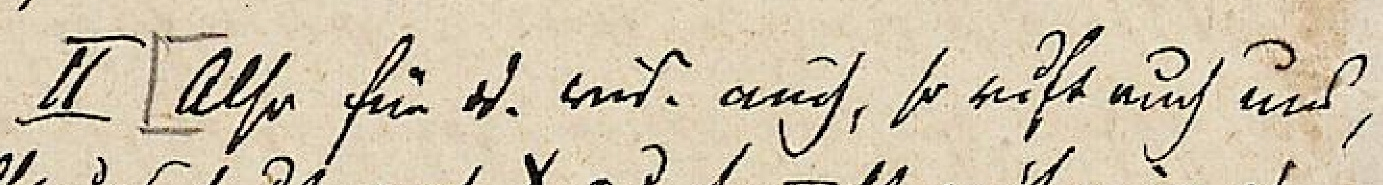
II [ Also für od. wid. auch, so ruft auch uns,
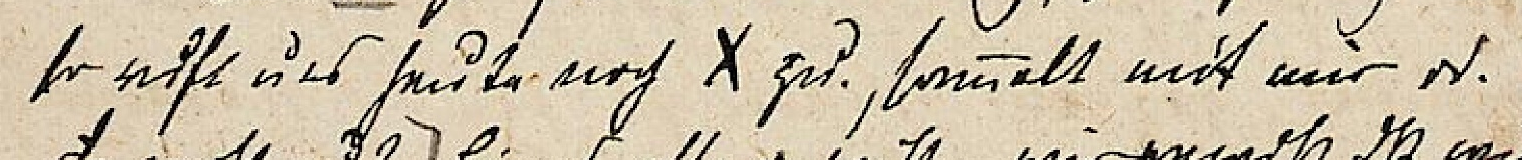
so uns heute noch Χ zu, samelt mit mir od.
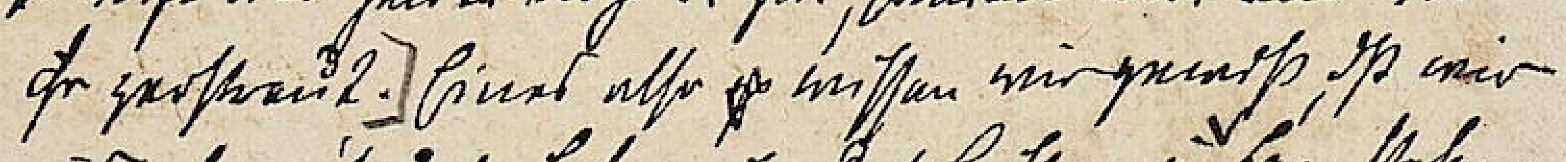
ihr zerstreut. ] Eines also zu wissen wir gewiß, dß wir
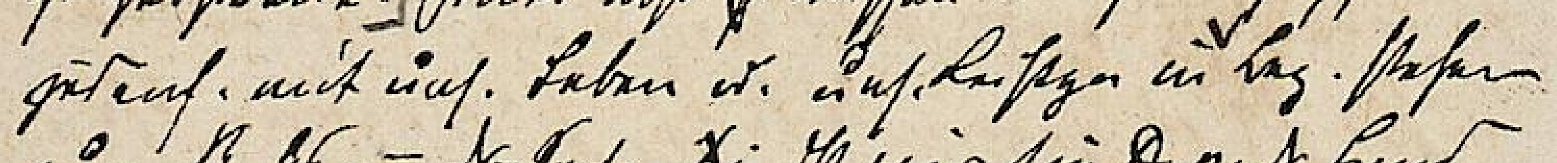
jedenf. mit uns. Leben u. uns. Leistgn in Bez. stehen
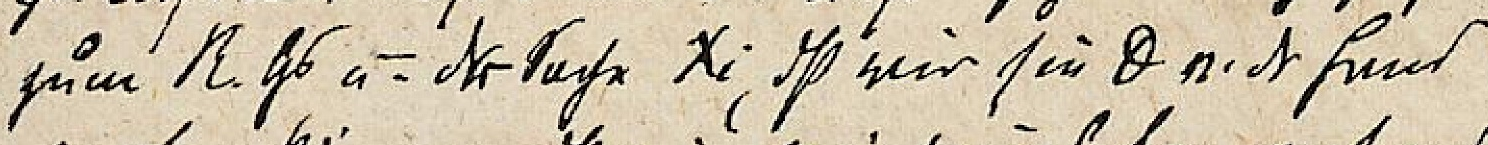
zum R. Gs u. dr. Sache Χι, daß wir sie o v. dr Hand
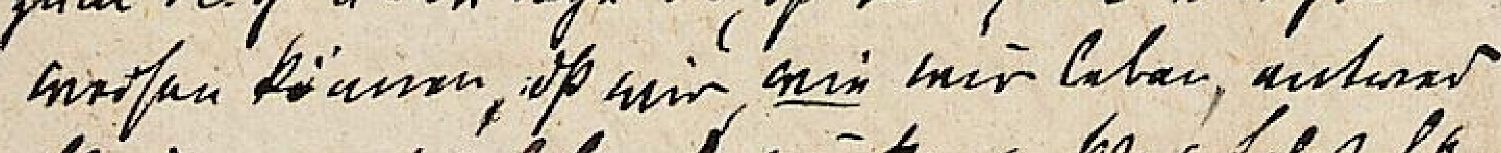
weisen können, dß wir, wie wir leben, entwed.
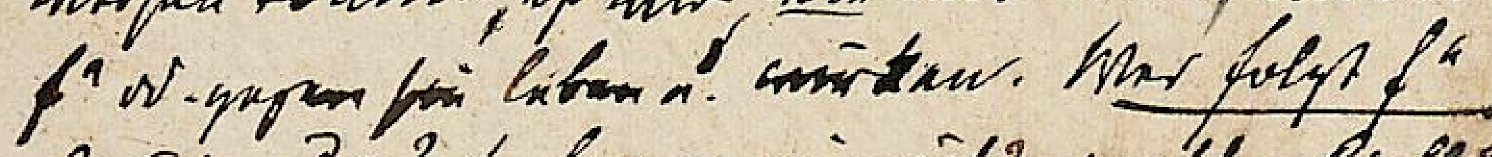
fü od. gegen sie leben u. wirken. Was folgt fü
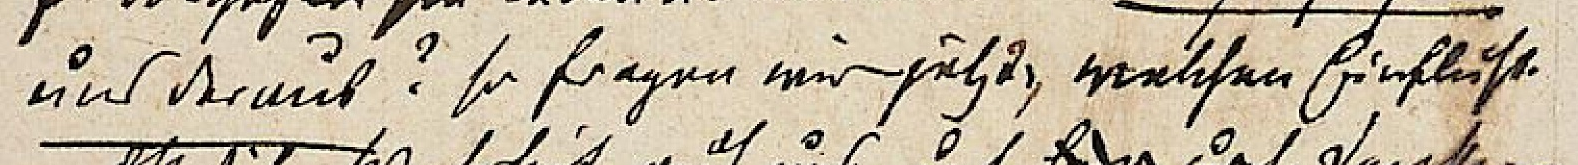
uns daraus? so fragen wir jetzt; welchen Einfluß
